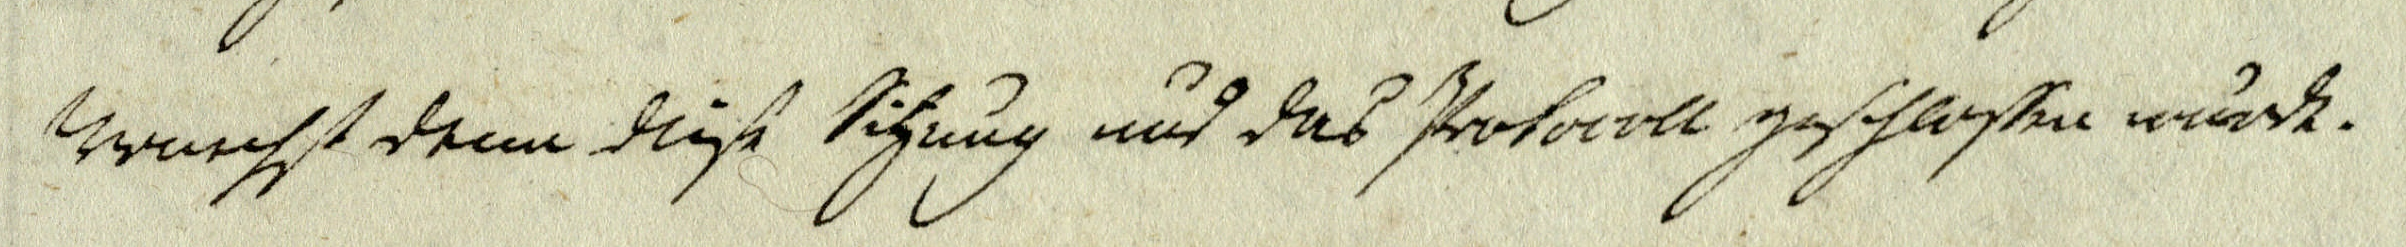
Wonechst denn diese Sitzung und das Protocoll geschlossen wurde.
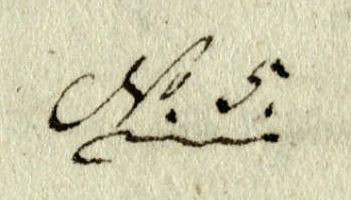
No 5.
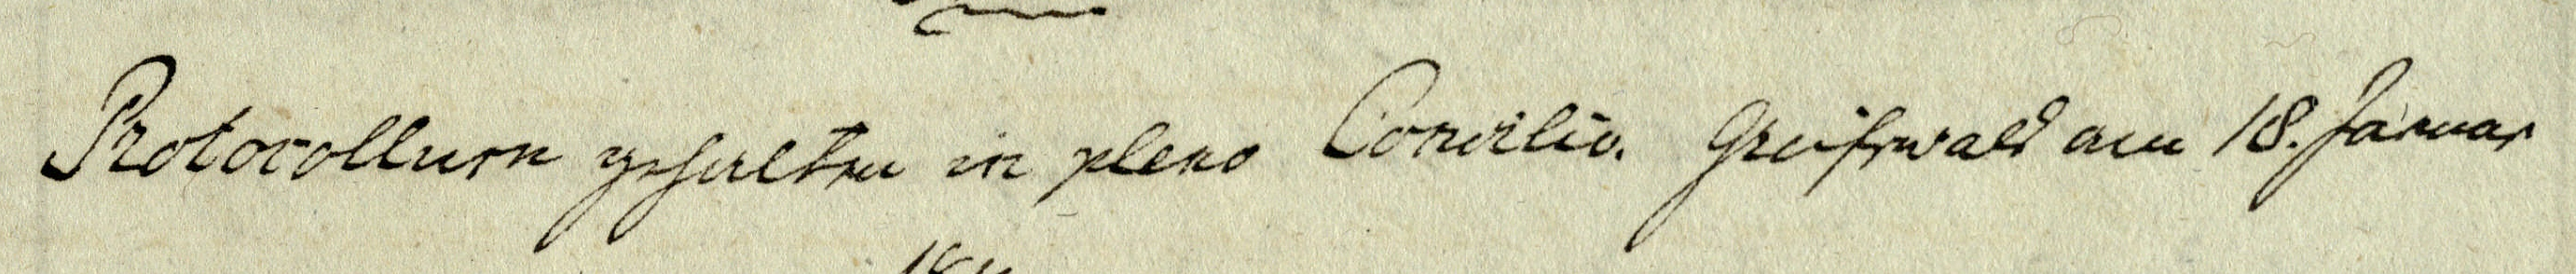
Protocollum gehalten in pleno Concilio. Greifswald am 18 Januar
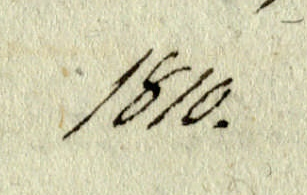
1810.
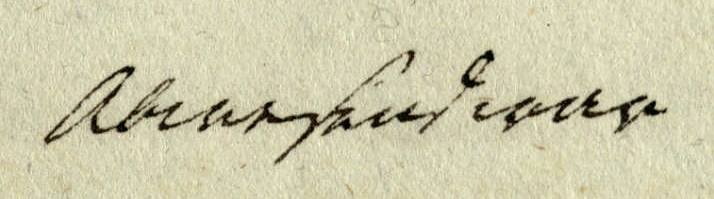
Abwesend war
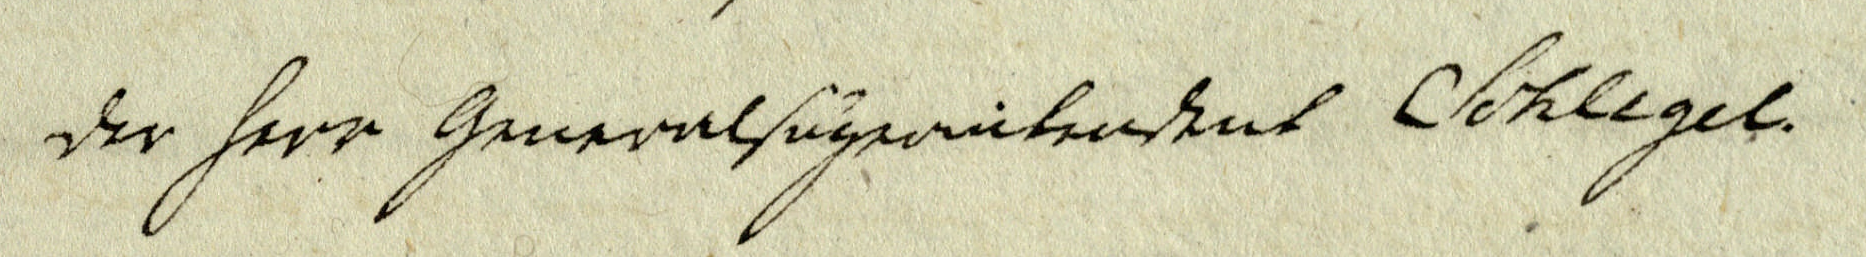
der Herr Generalsuperintendent Schlegel.
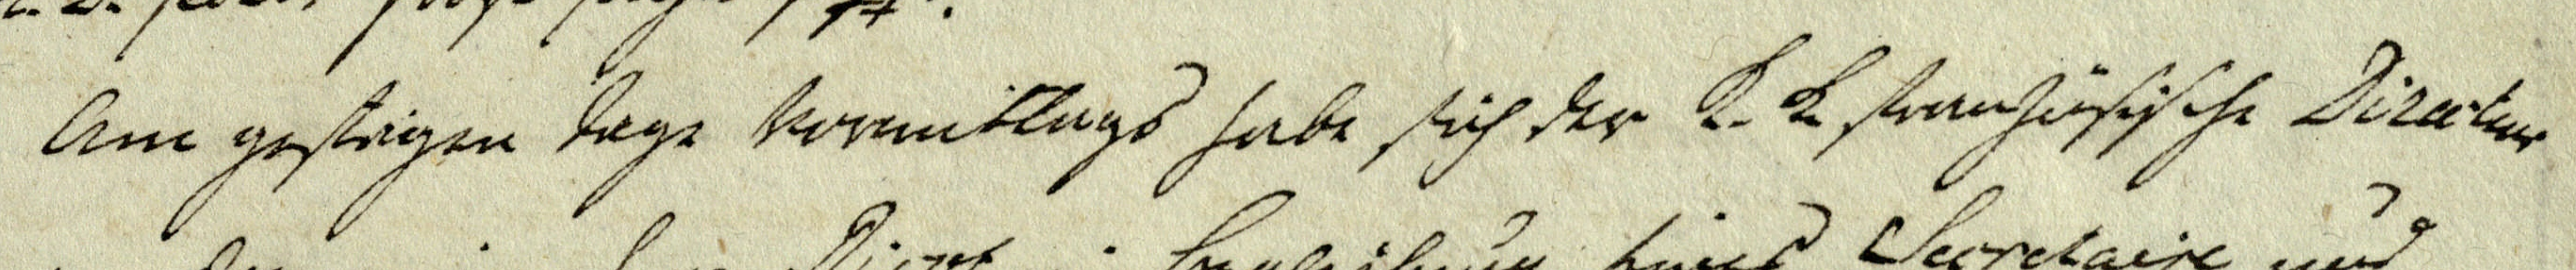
Am gestrigen Tage Vormittags habe sich der K. K französische Directeur
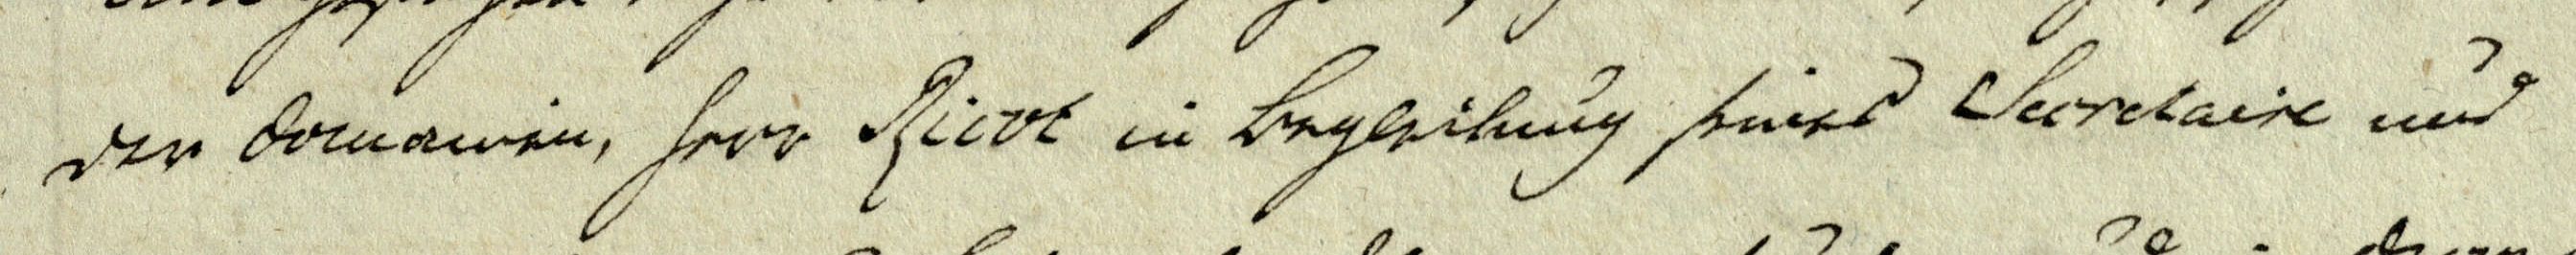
der Domainen, Herr Ricot in Begleitung seines Secretaire und
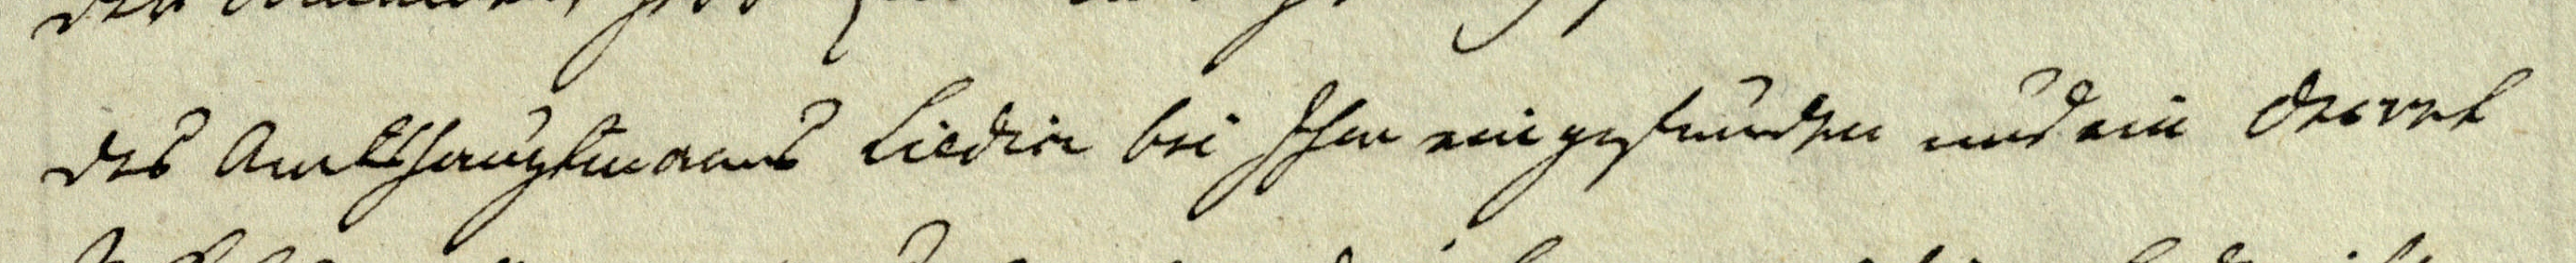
des Amtshauptmanns Liedin bei Ihm eingefunden und ein Decret
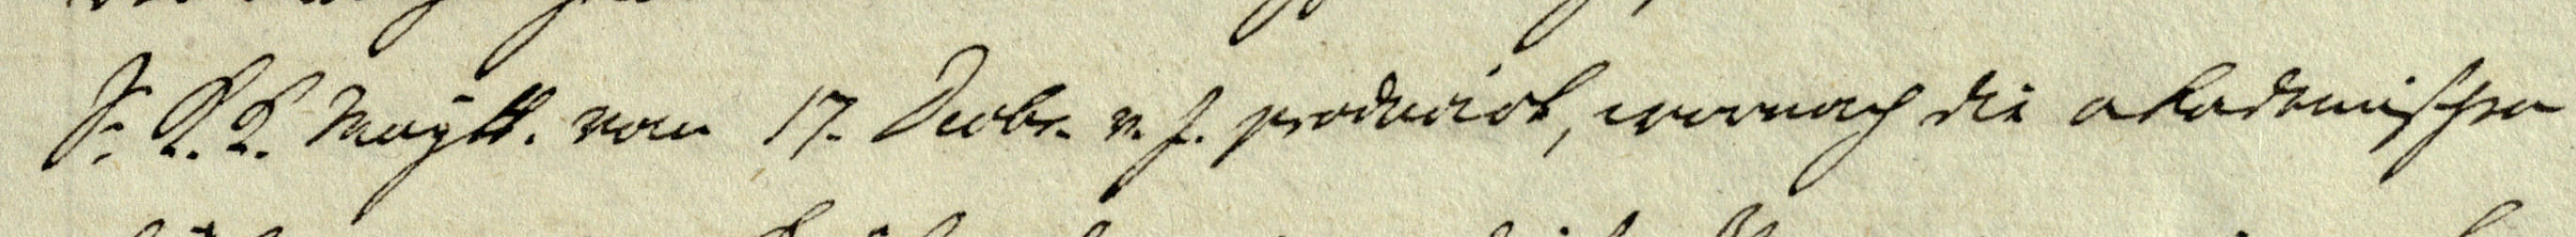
S. K. K. Maÿtt. vom 17. Decbr. v. J. producirt, wornach die akademischen
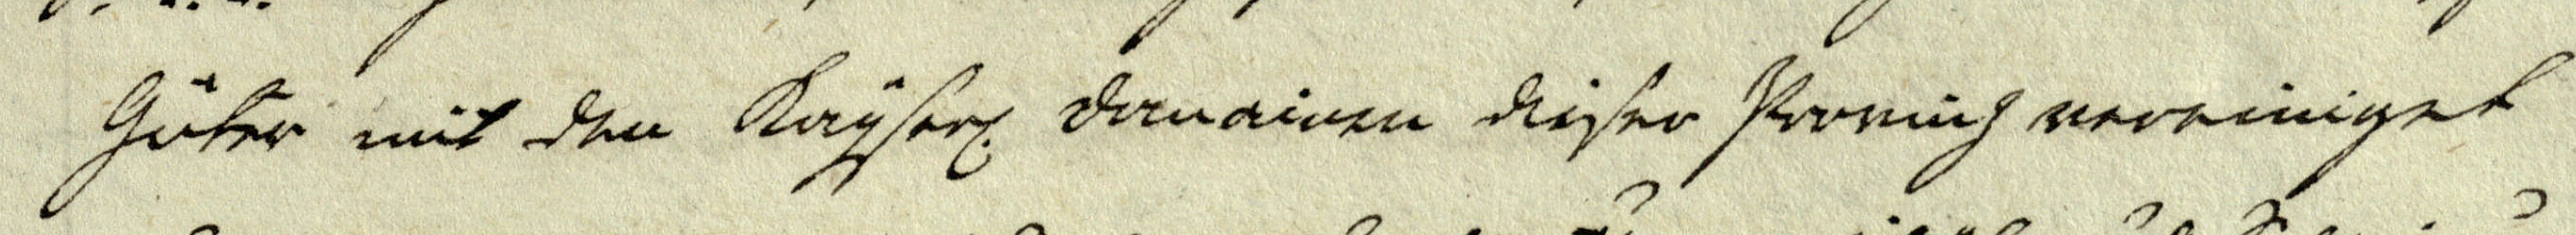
Güter mit den Kaÿserl Domainen dieser Provinz vereiniget
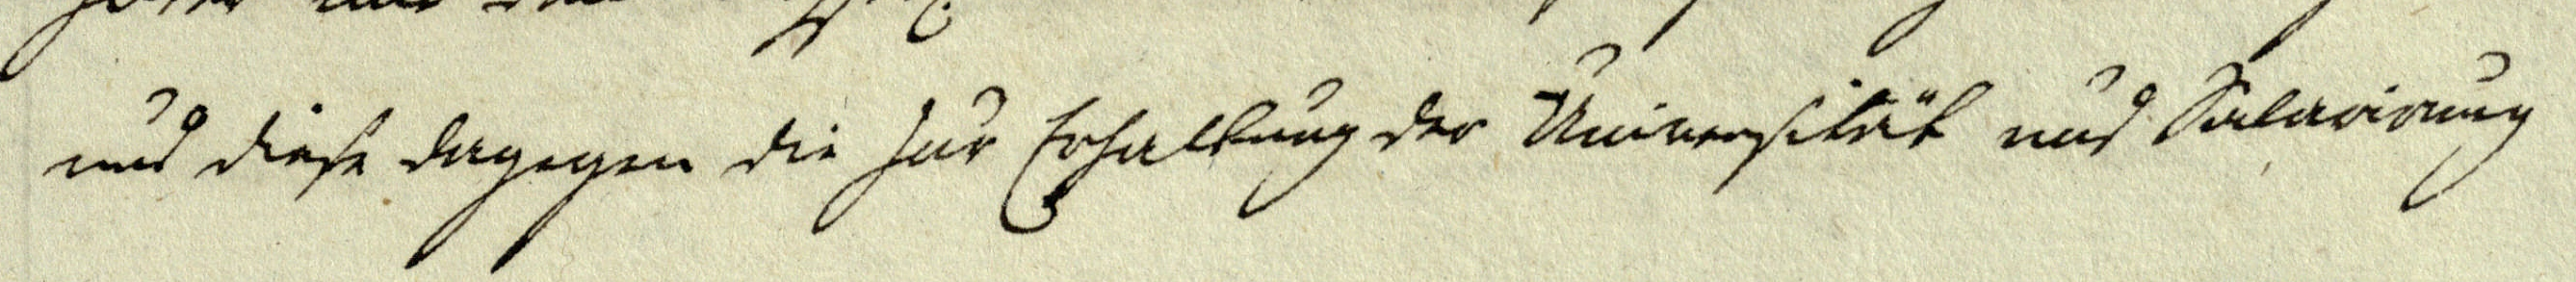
und diese dagegen die zur Erhaltung der Universität und Salarirung
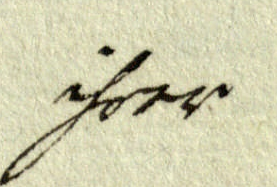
ihrer
